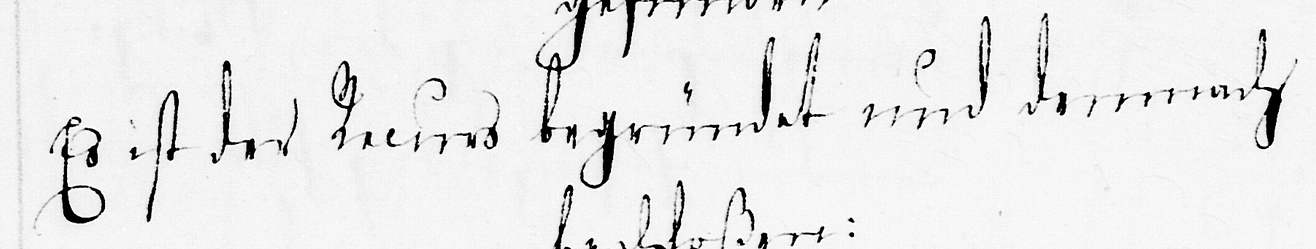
Es ist der Recurs begründet und demnach
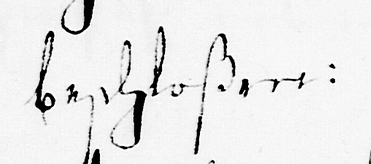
beschloßen:
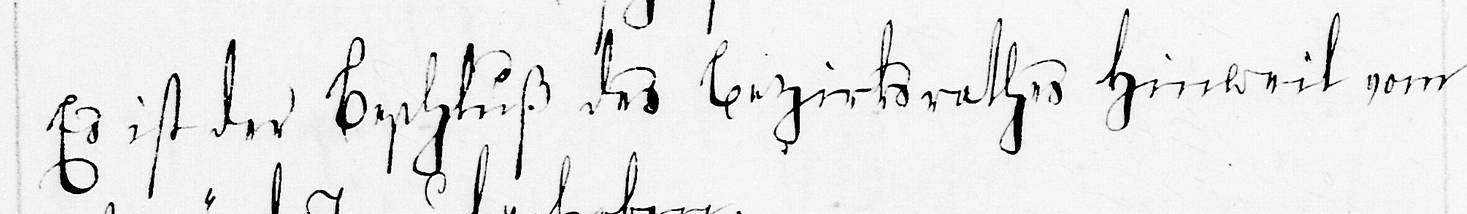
Es ist der Beschluß des Bezirksrathes Hinweil vom
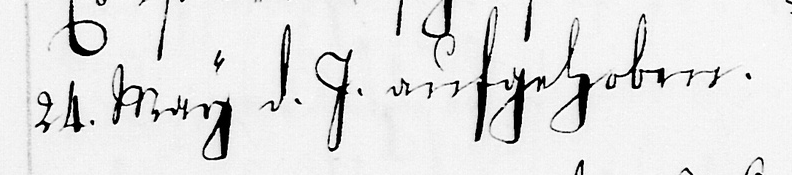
24. May d. J. aufgehoben.
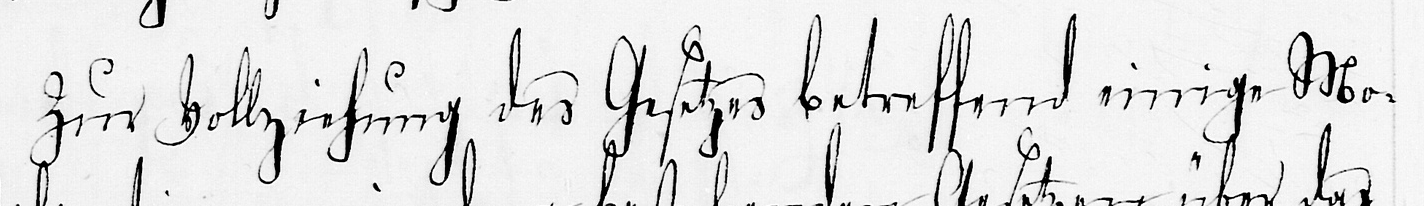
Zur Vollziehung des Gesetzes betreffend einige Mo¬
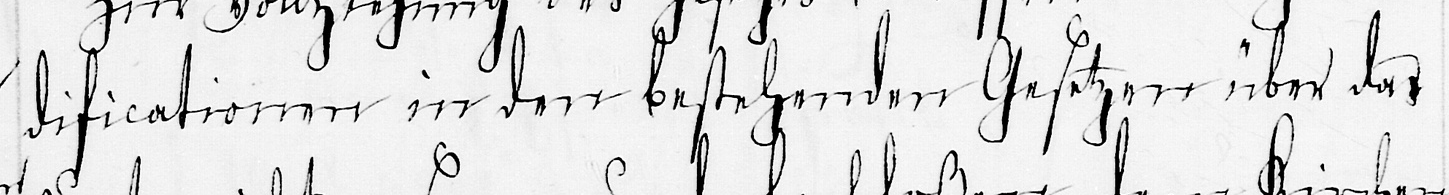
dificationen in den bestehenden Gesetzen über das
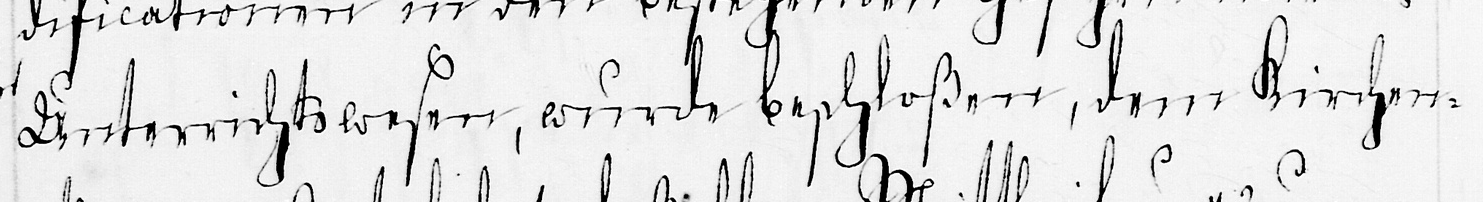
Unterrichtswesen, wurde beschloßen, dem Kirchen¬
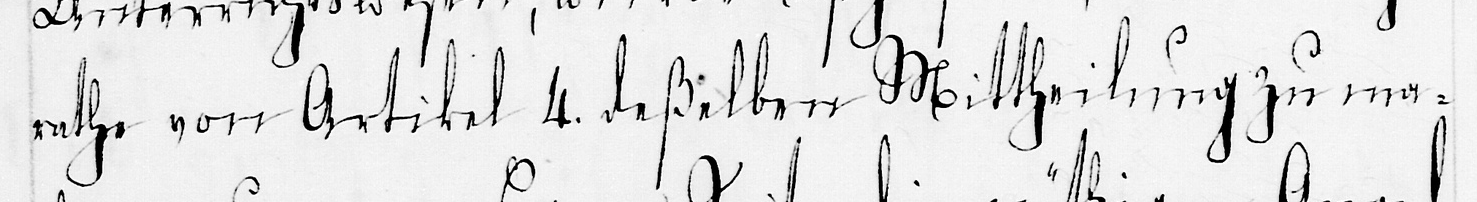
rathe von Artikel 4. deßelben Mittheilung zu ma¬
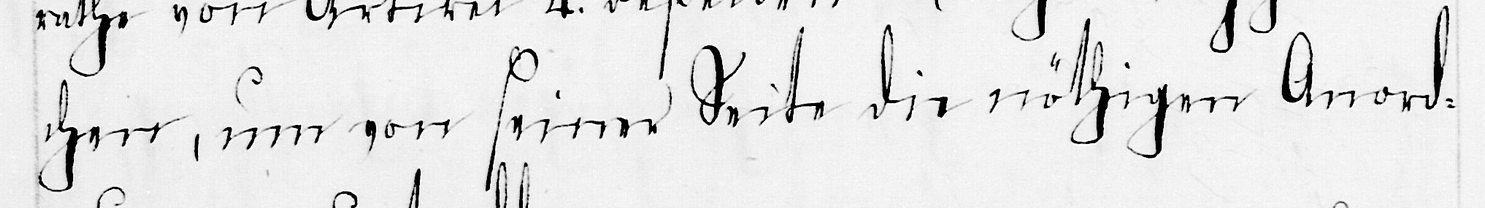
chen, um von seiner Seite die nöthigen Anord¬
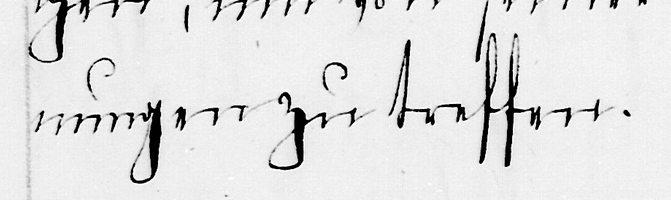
nungen zu treffen.
